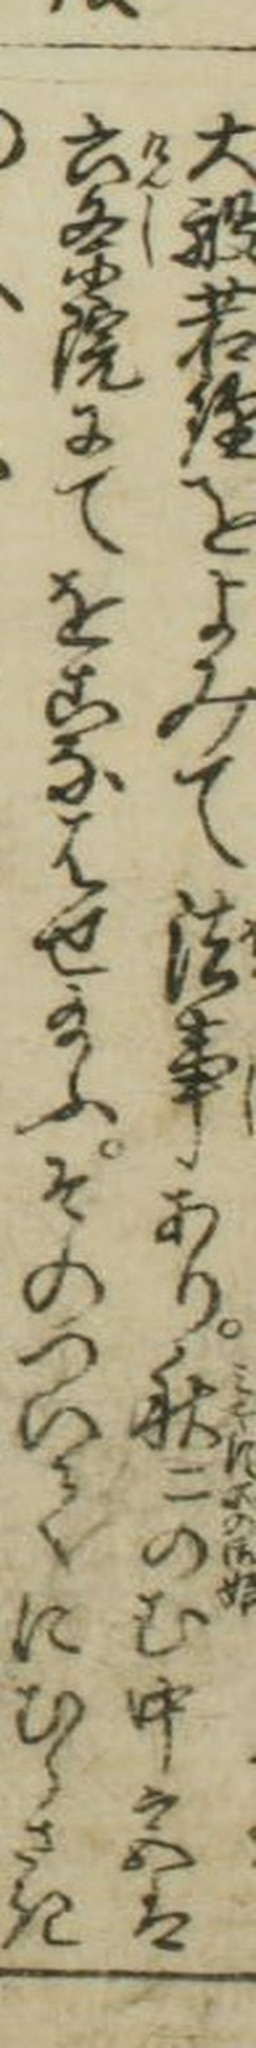六条院にてをこなはせ給ふ。そのついてにむらさき
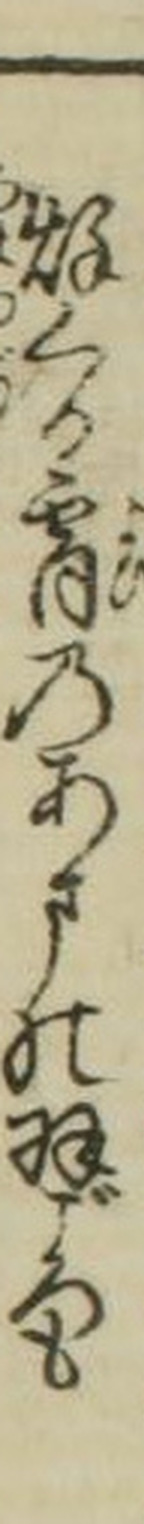秋くる宵のあさの羽ごろも
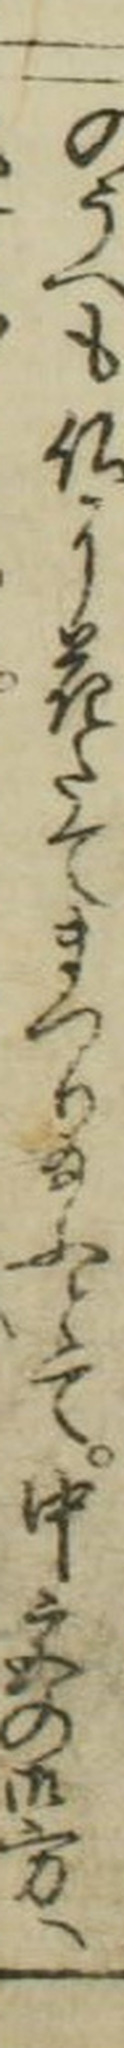のうへも仏に花たてまつり給ふとて。中宮の御方へ
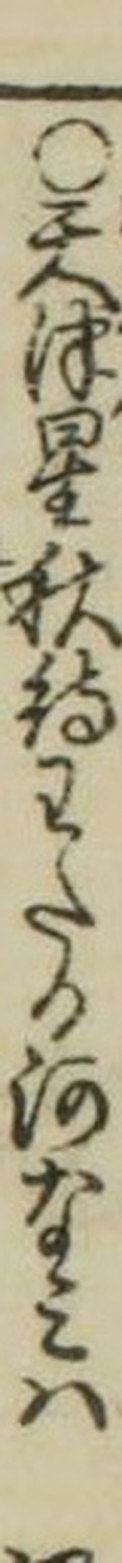○天津星秋待わたる河なみは資茂
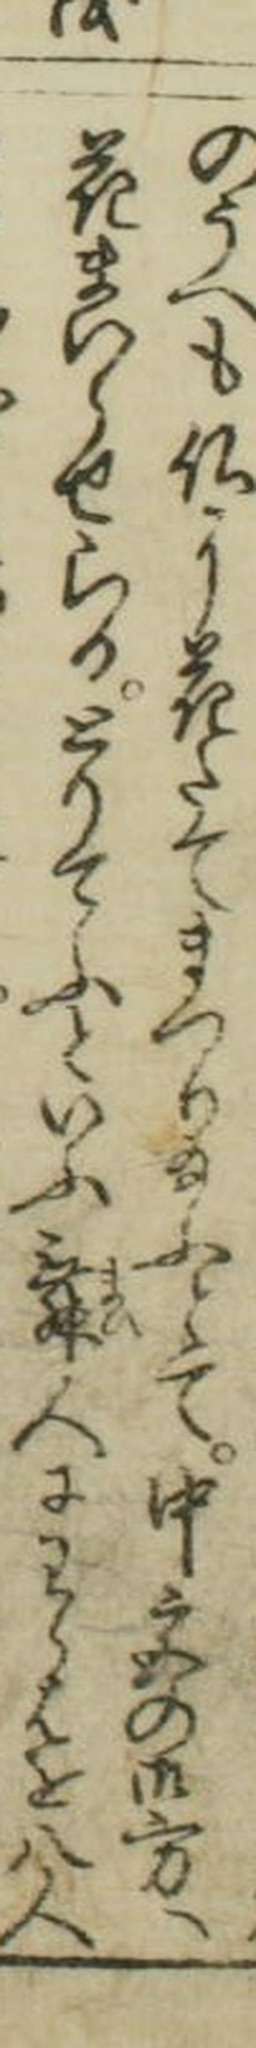花まいらせらる。とりてふといふ舞人にわらはを八人
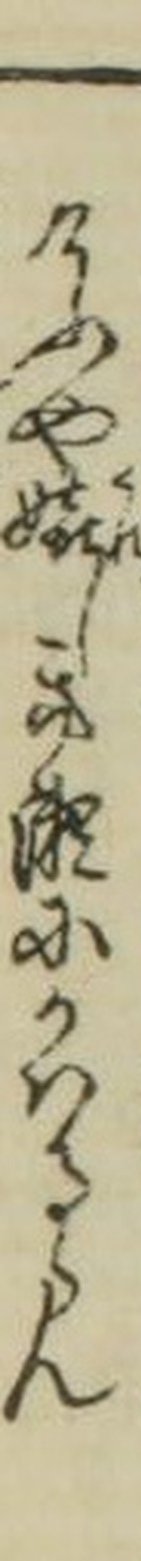けふや嬉しき瀬にかはるらん
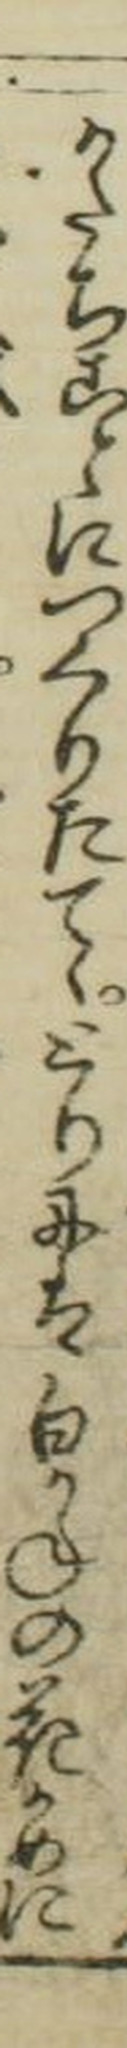かたちことにつくりたてゝ。とりには白かねの花かめに
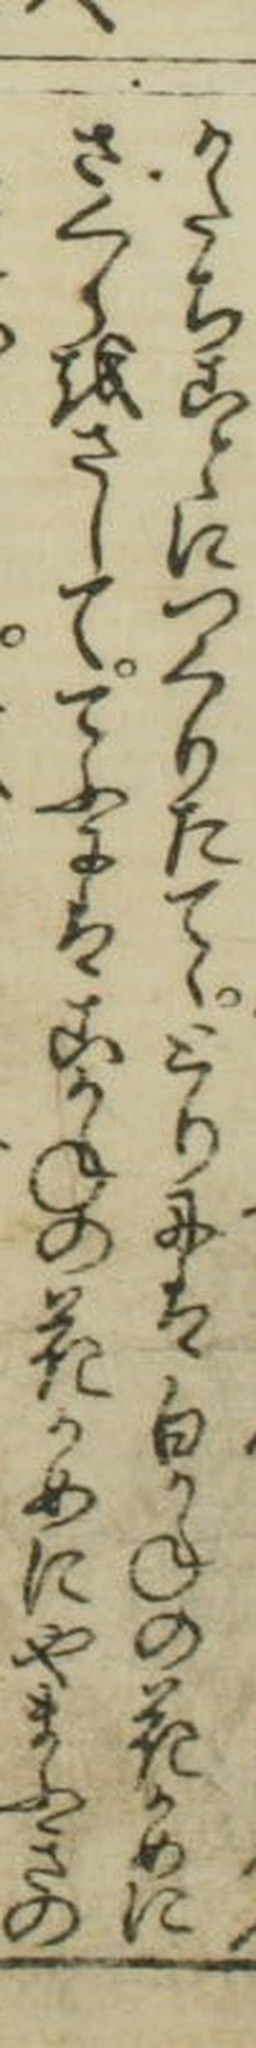さくらをさして。てふにはこかねの花かめにやまふきの
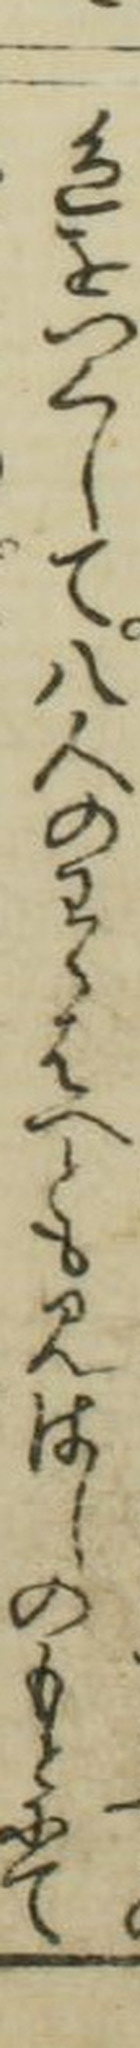色をつくして。八人のわらはへともみはしのもとにて
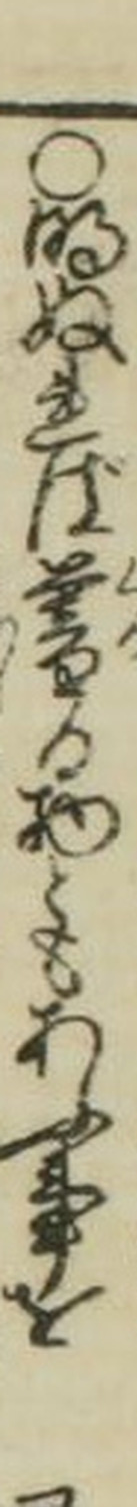○明ぬれば暮る物ともあふ事を通茂
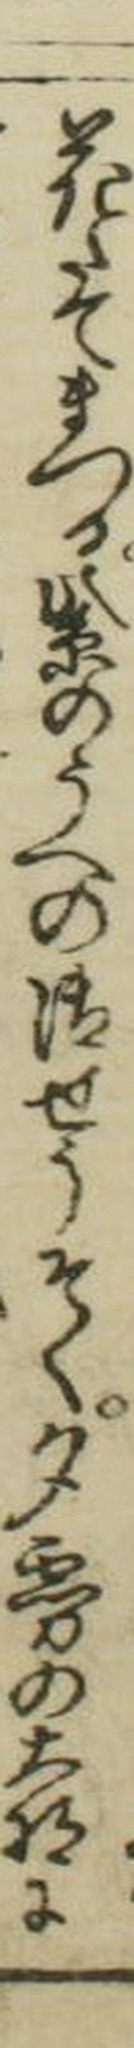花たてまつる。紫のうへの御せうそく。夕霧の大将に
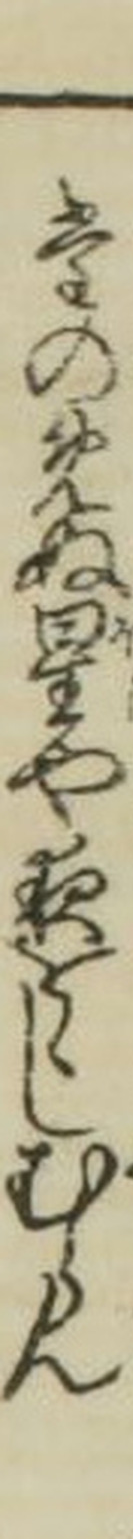たのめぬ星や夜をゝしむらん
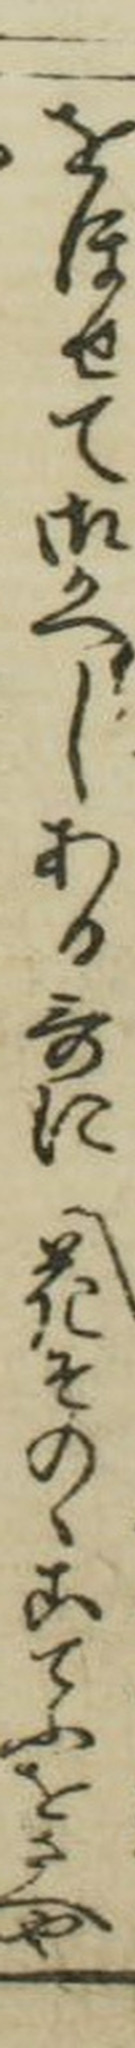をほせて御かへしある哥に〽花そのゝこてふをさへや
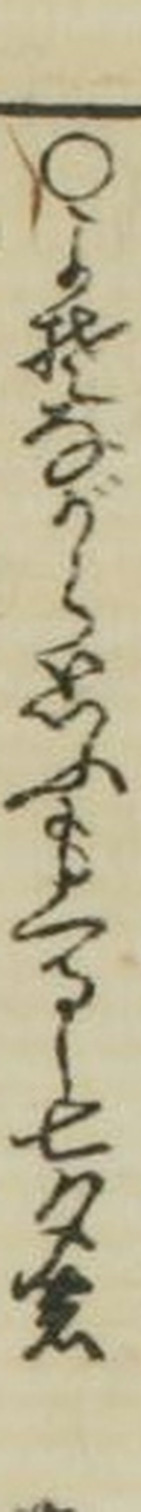○よそながら思ふもくるし七夕は内房
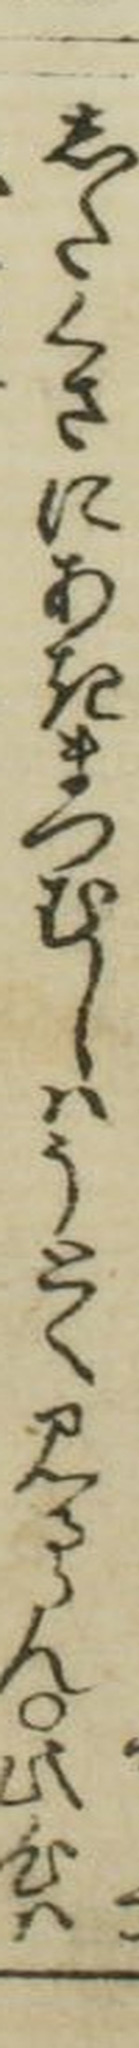したくさにあきまつむしはうとく見るらん○此心は
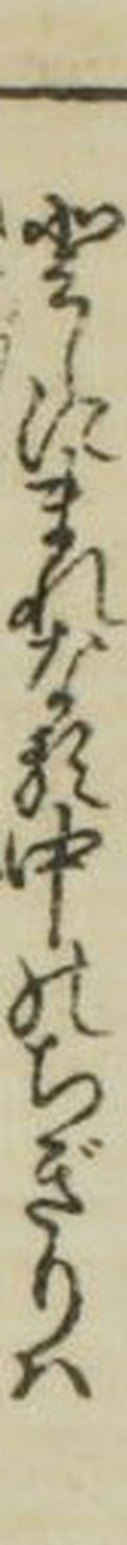としにまれなる中のちぎりは
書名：女源氏教訓鑑
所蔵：東京学芸大学附属図書館
